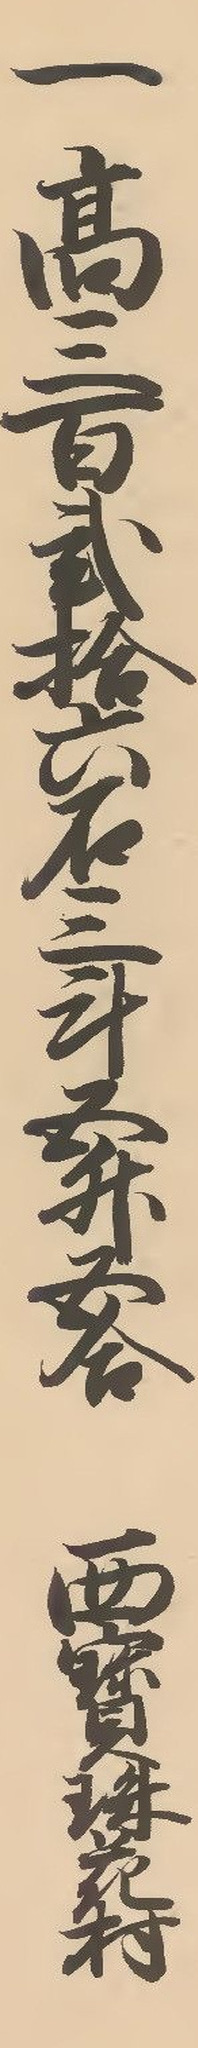一高三百弐拾六石三斗五升五合西宝珠花村

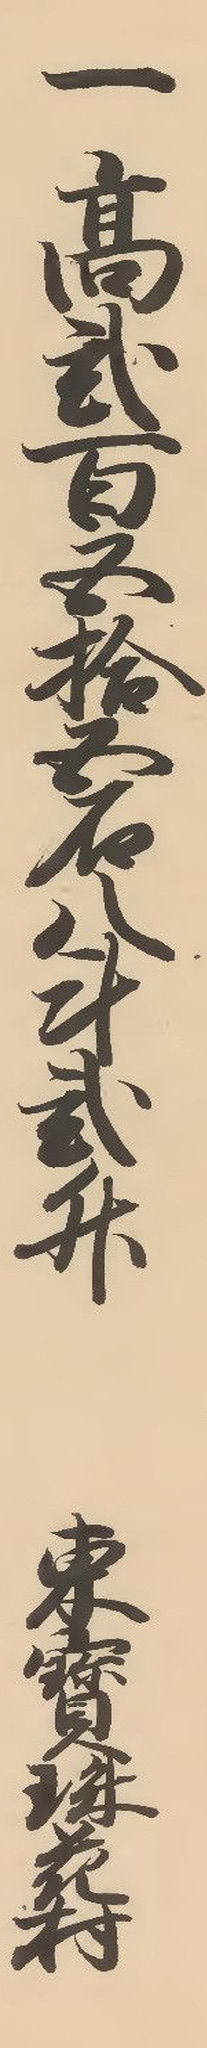一高弐百五拾五石八斗弐升東宝珠花村
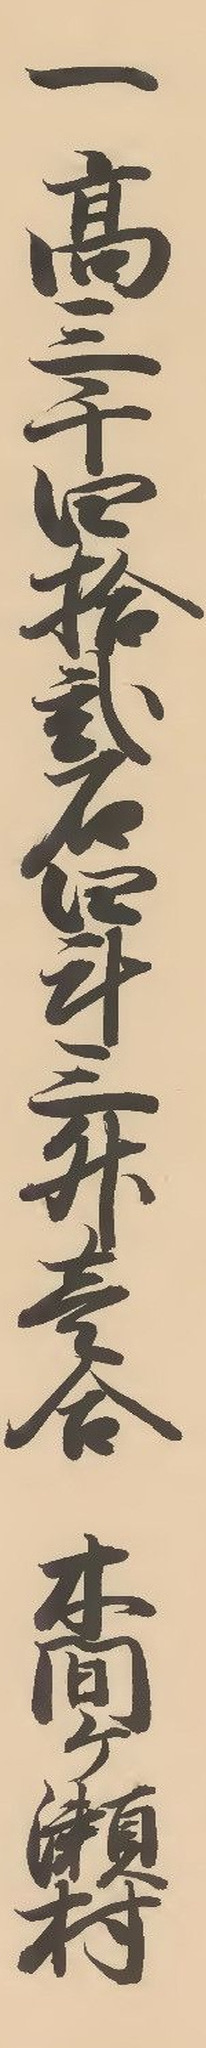一高三千四拾弐石四斗三升壱合木間ヶ瀬村
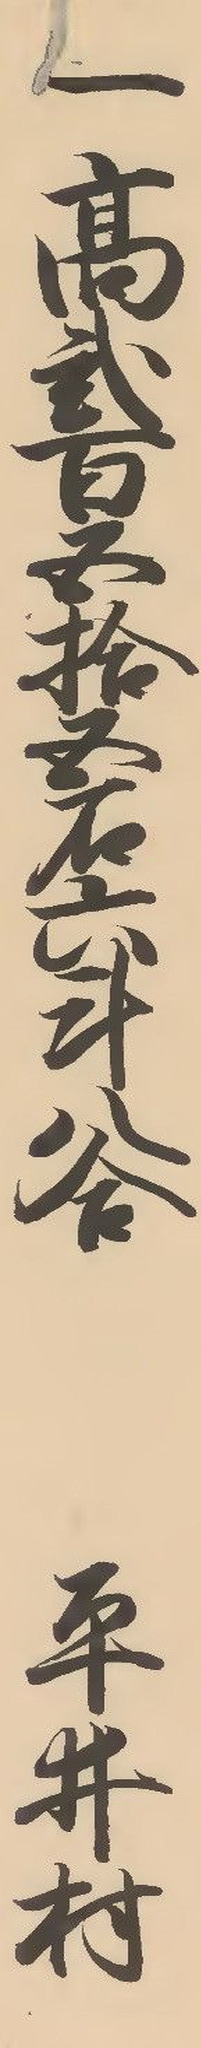一高弐百五拾五石六斗八合平井村
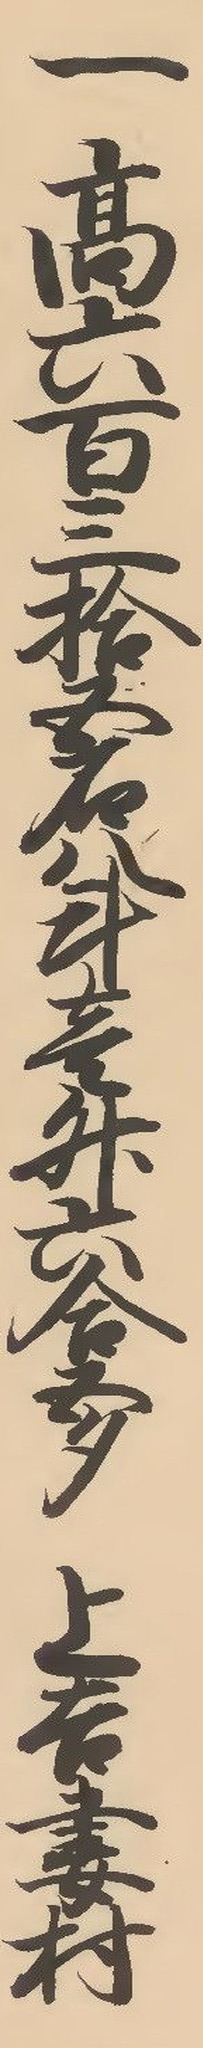一高六百三拾五石八斗壱升六合五勺上吉妻村
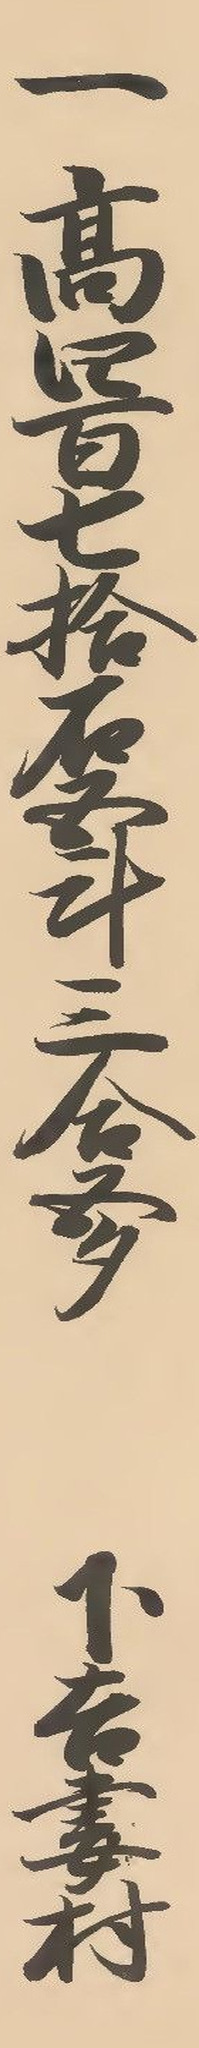一高四百七拾石五斗三合五勺下吉妻村
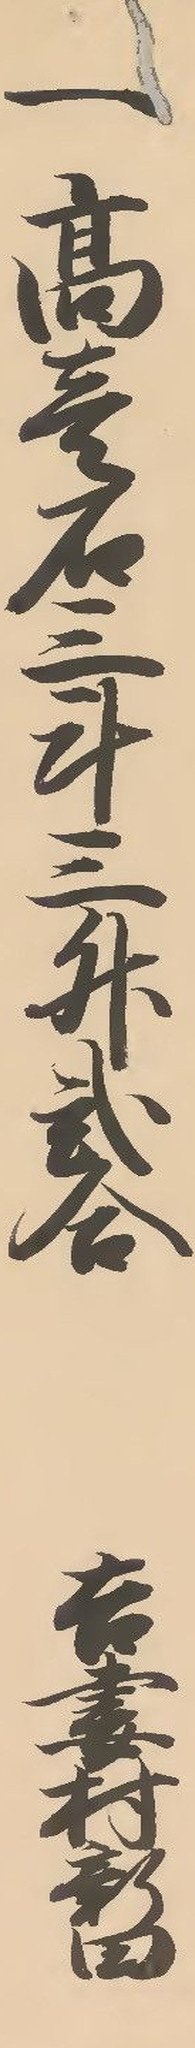一高壱石三斗三升弐合吉妻村新田
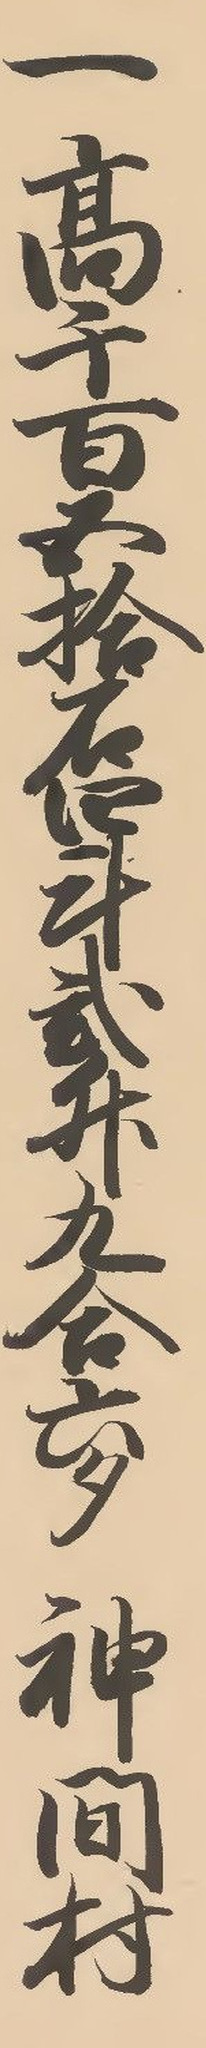一高千百五拾石四斗弐升九合六勺神間村
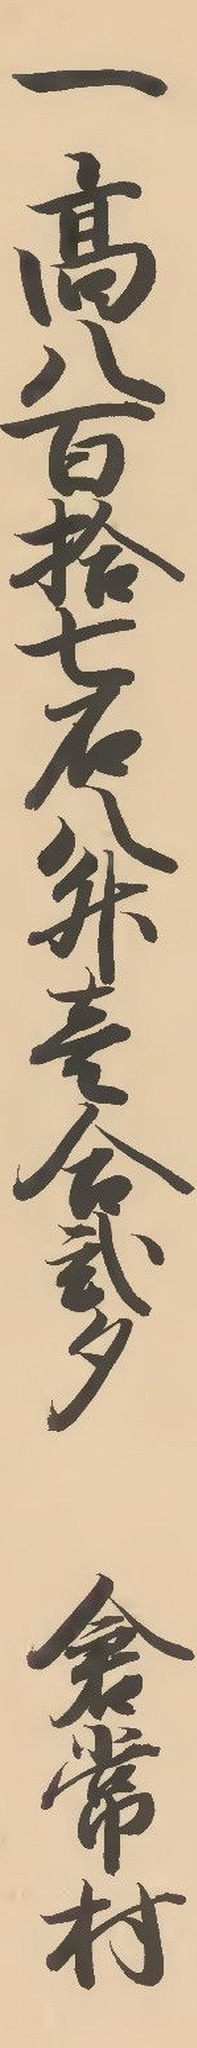一高八百拾七石八升壱合弐勺倉常村

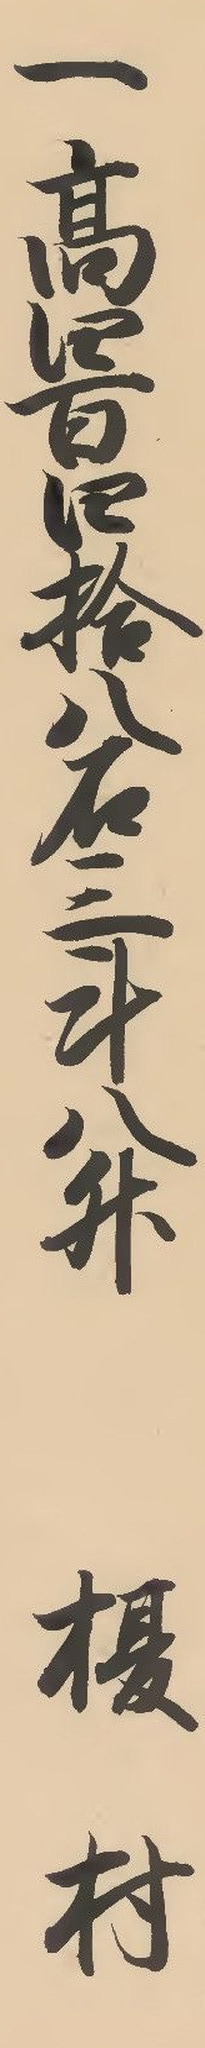一高四百四拾八石三斗八升榎村
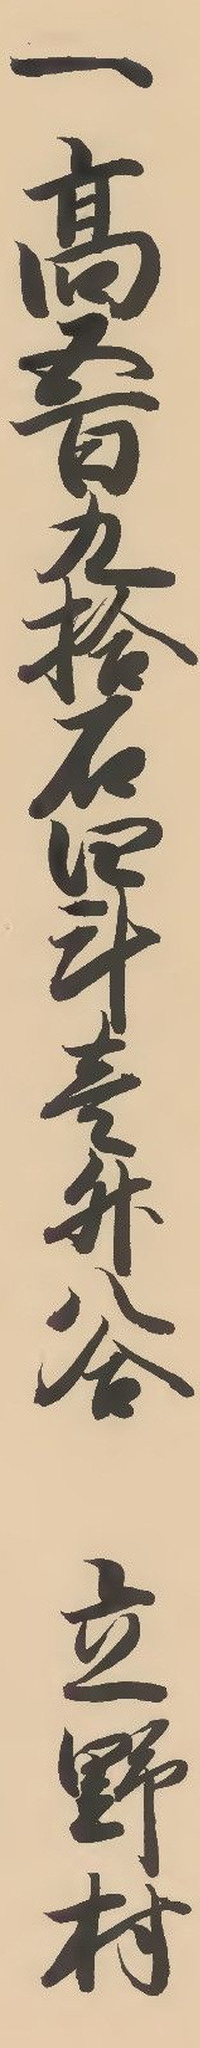一高五百九拾石四斗壱升八合立野村
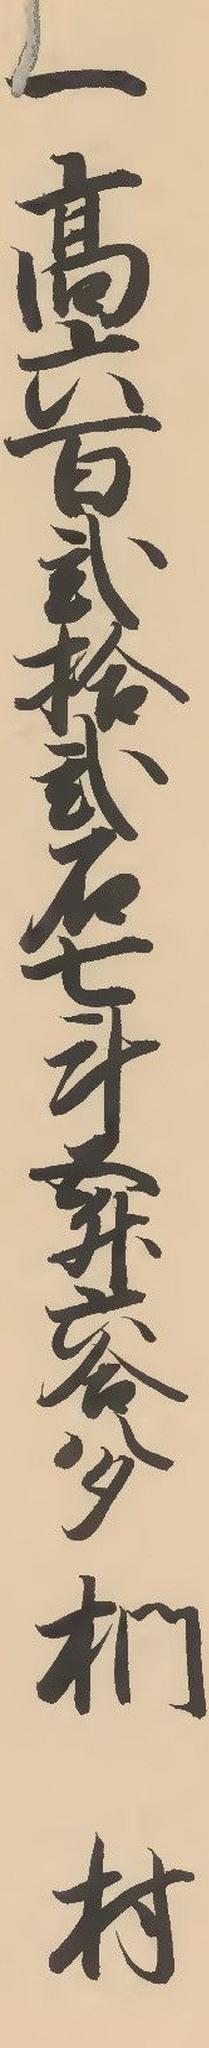一高六百弐拾弐石七斗五升六合八勺椚村
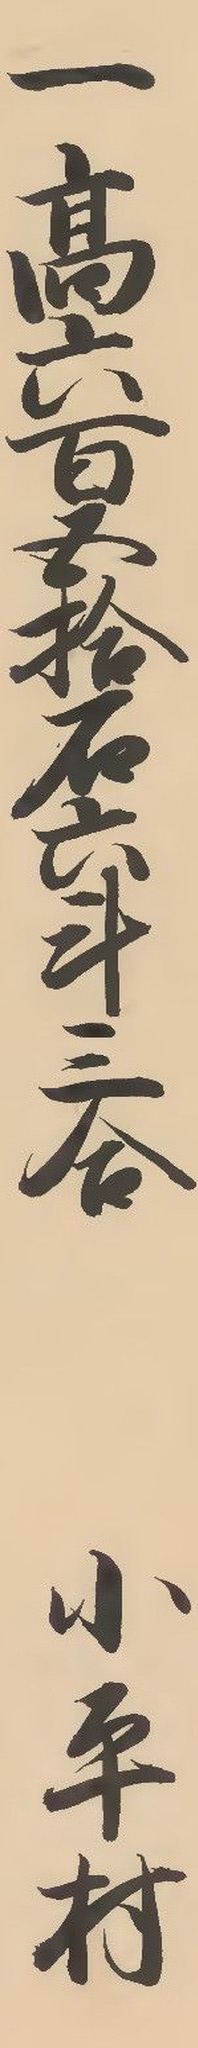一高六百五拾石六斗三合小平村
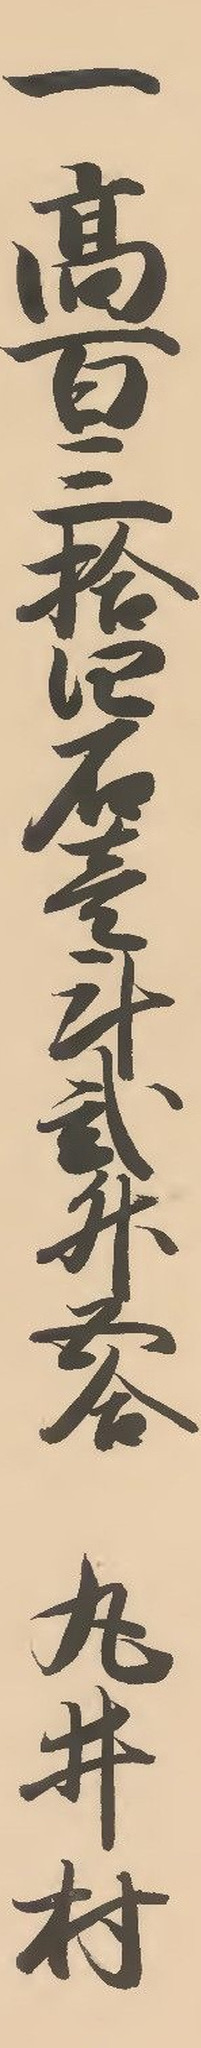一高百三拾四石壱斗弐升五合丸井村
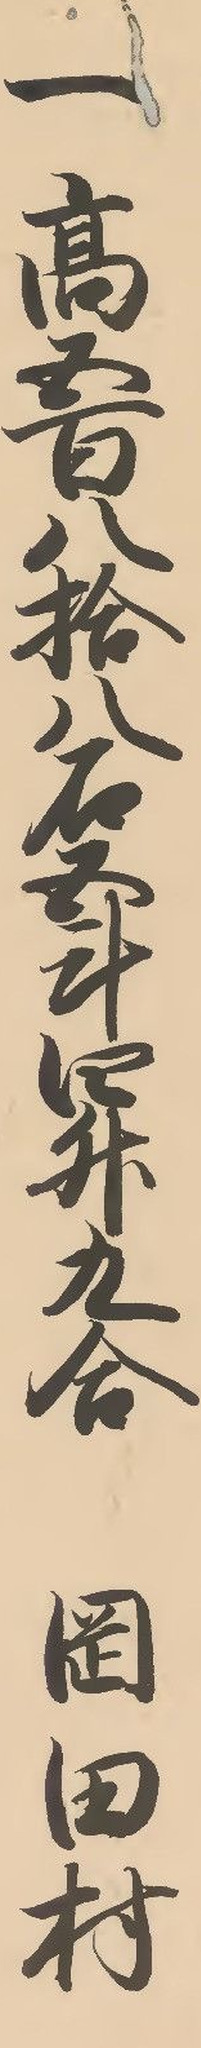一高五百八拾八石五斗四升九合岡田村
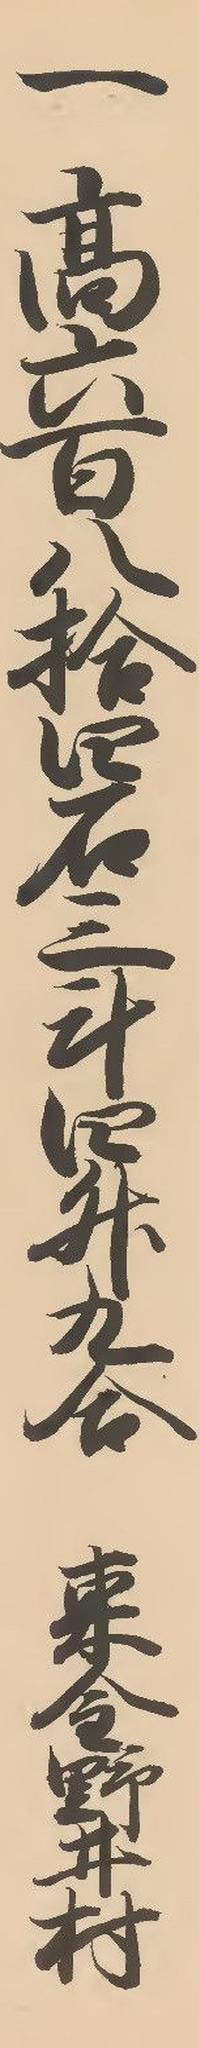一高六百八拾四石三斗四升九合東金野井村
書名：下総国郷帳
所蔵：国立公文書館 National Archives of Japan
